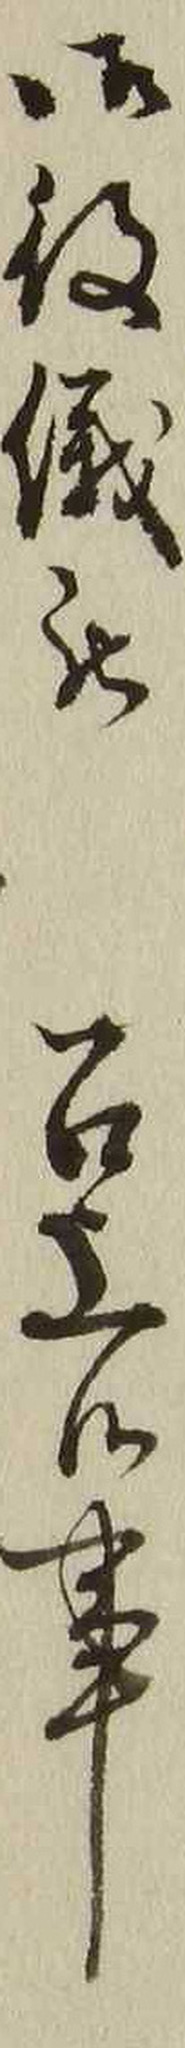御役儀被召上候事
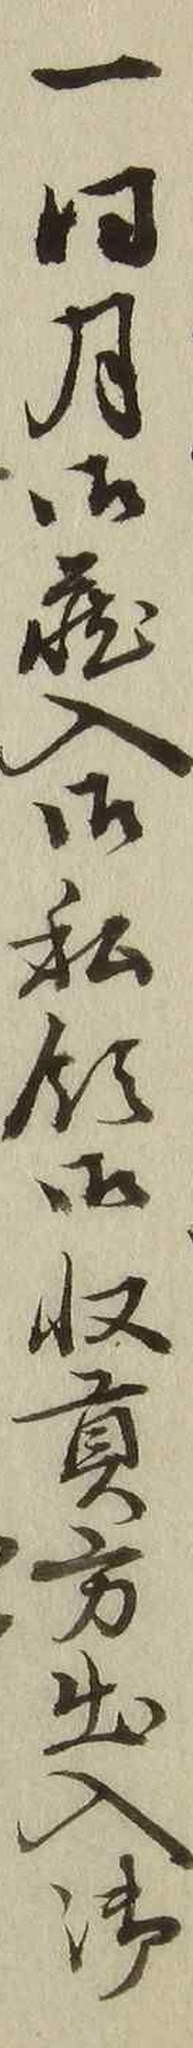一同月御蔵入御私領御収貢方出入御
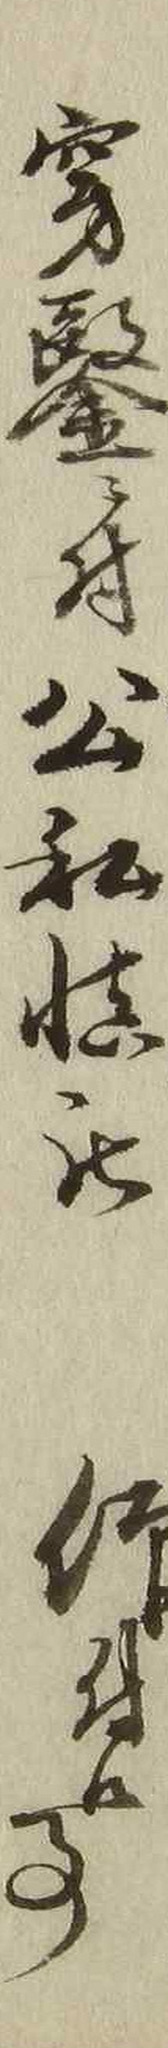穿鑿ニ付公私慎被仰付候事
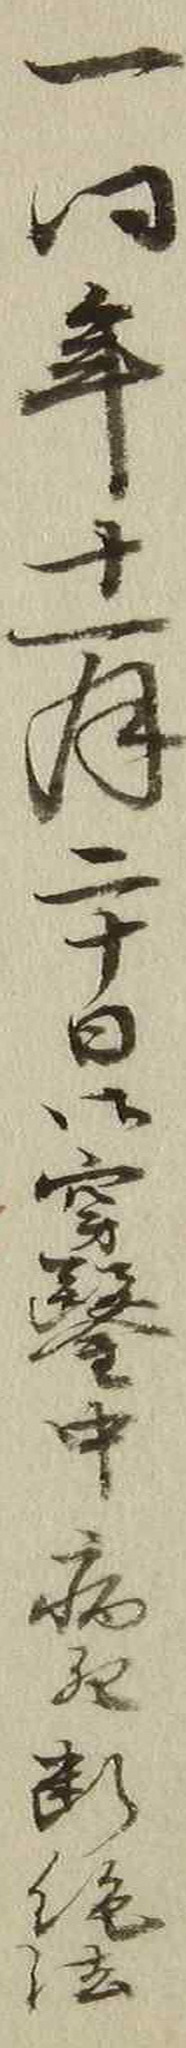一同年十一月二十日御穿鑿中病死断絶法
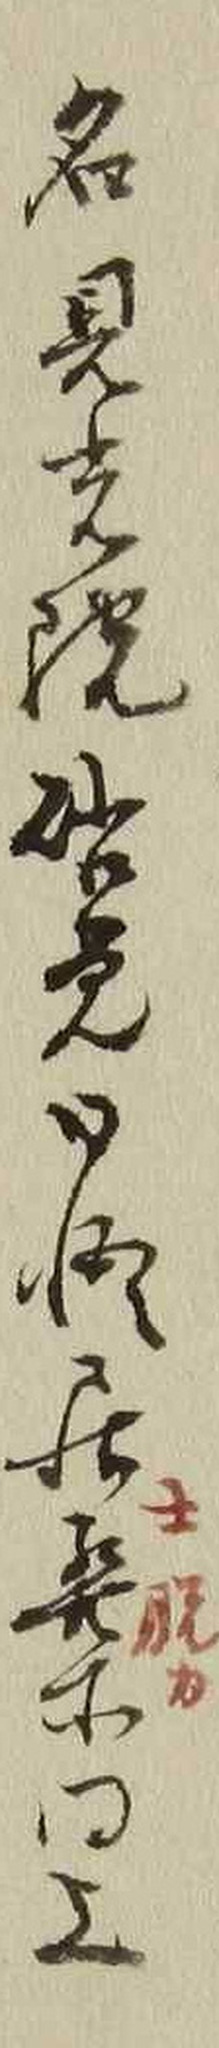名見光院啓覚日悟居葬所同上
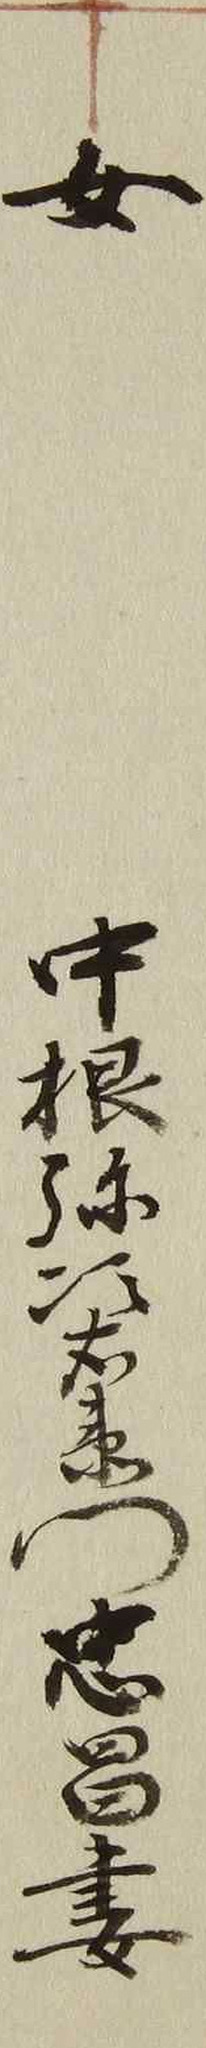女中根弥次右衛門忠昌妻
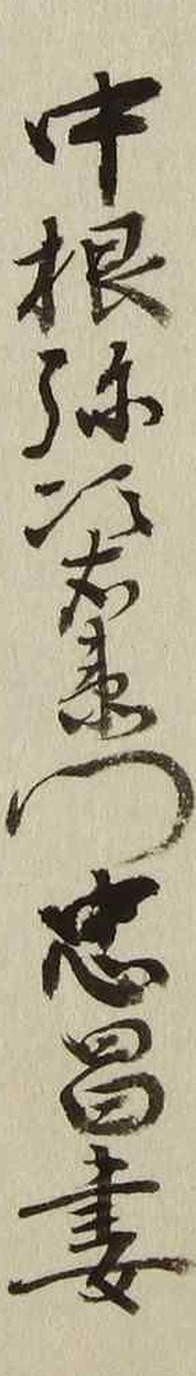女中根弥次右衛門忠昌妻
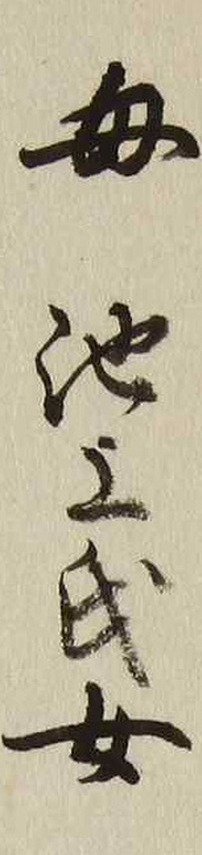母池上氏女
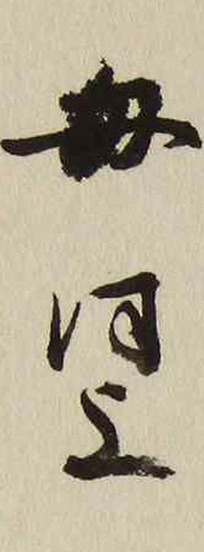母同上

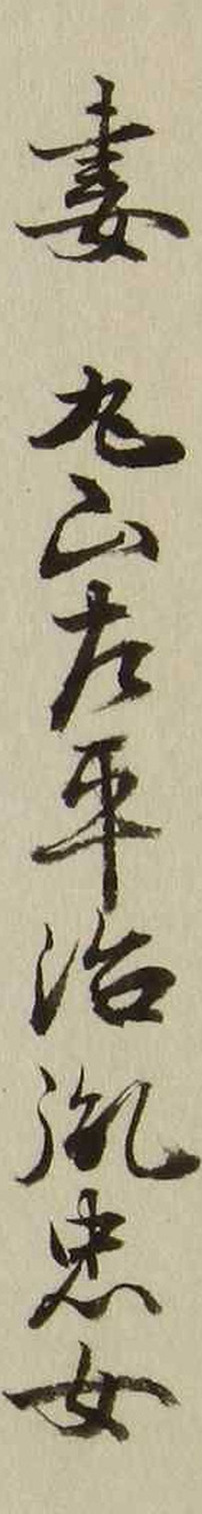妻丸山左平治胤忠女
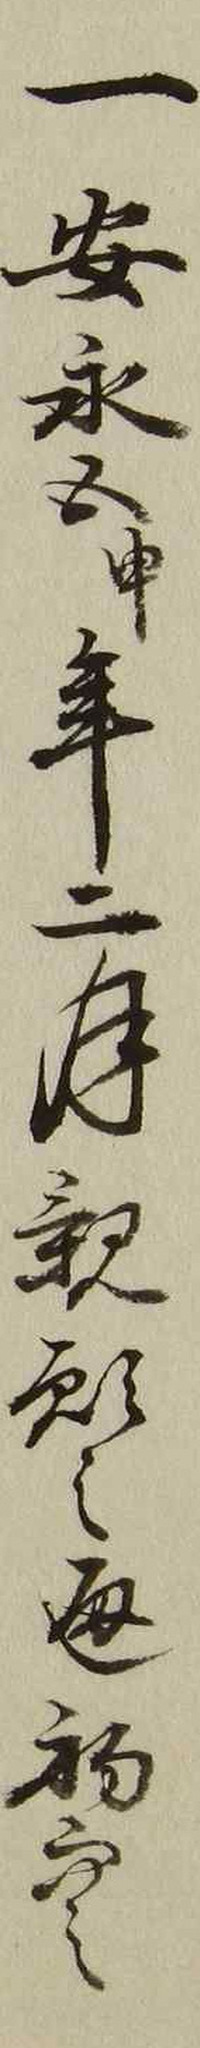一安永五申年二月親願之通初而之
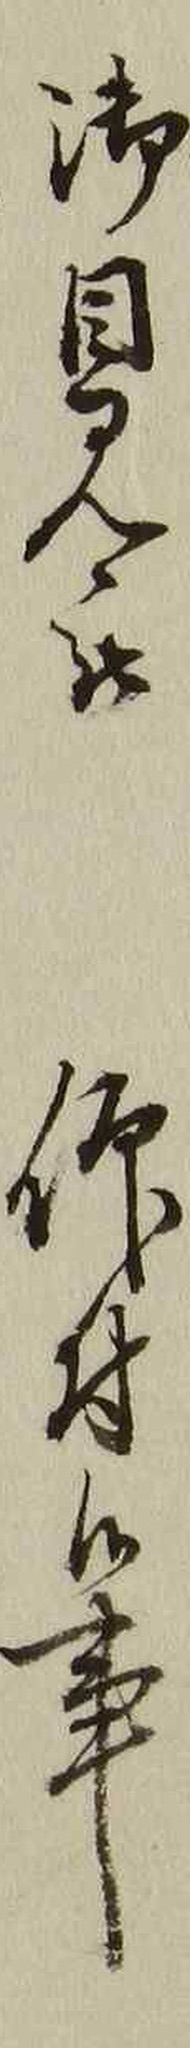御目見被仰付候事
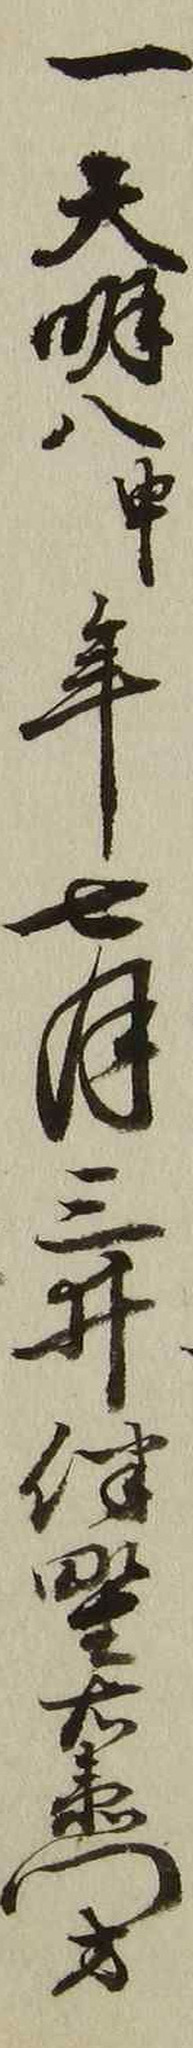一天明八申年七月三井伴野右衛門方
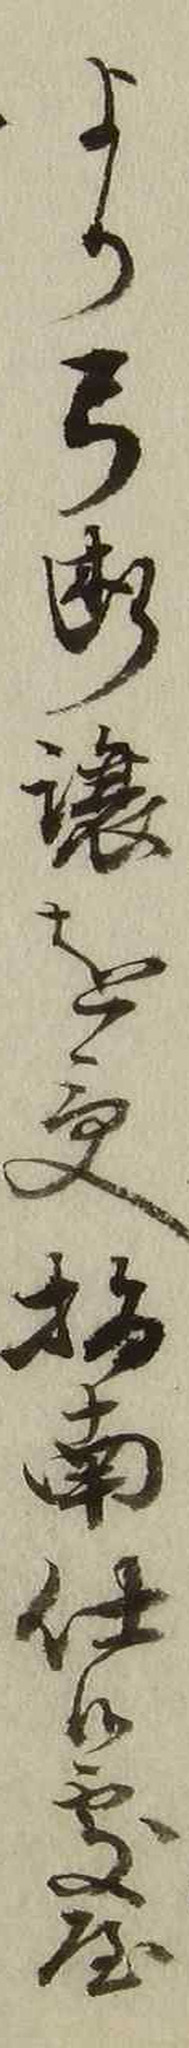より弓断譲を受指南仕候処屋
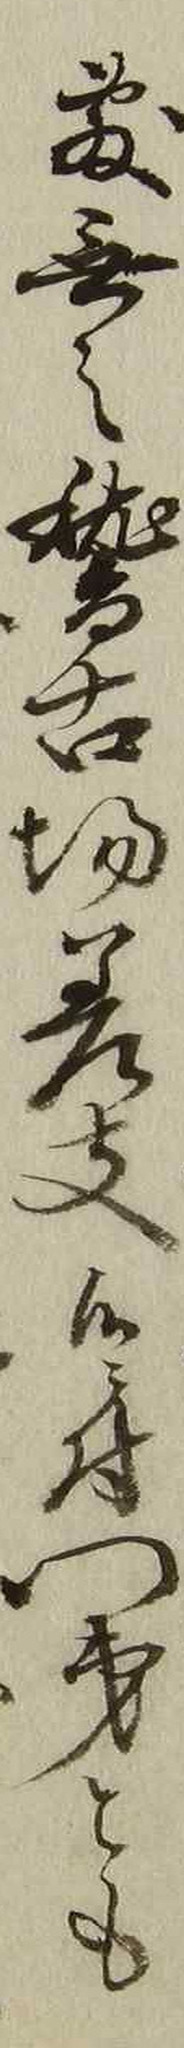敷無之稽古場差支候ニ付門弟とも
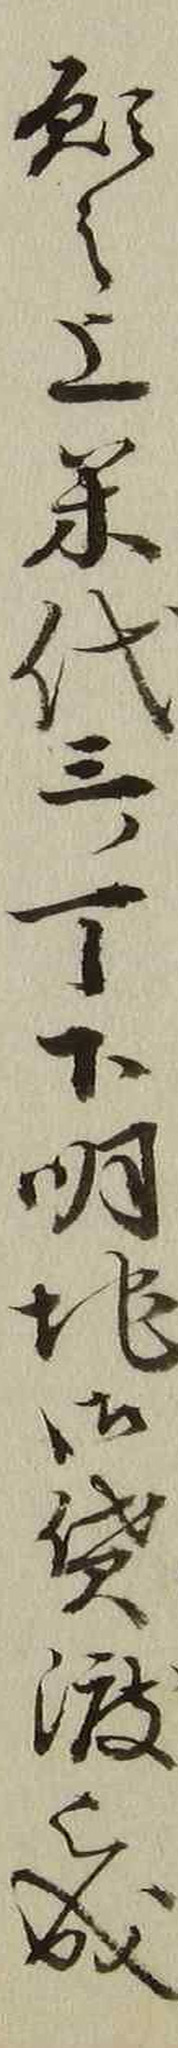願之上米代三ノ丁下明地御貸渡被成
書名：諸士系譜　巻之36　は之部4
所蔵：会津若松市立会津図書館
